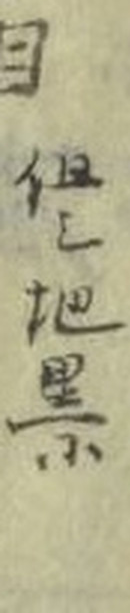但し地黒に
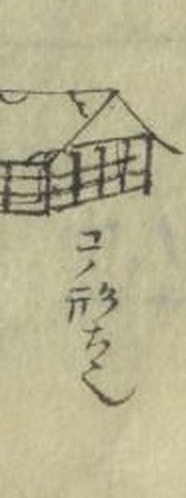コノ形ち也
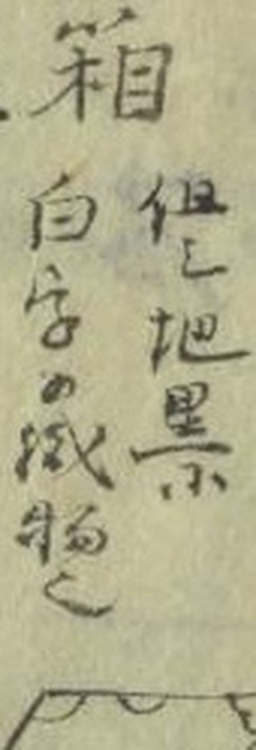白字の織物也
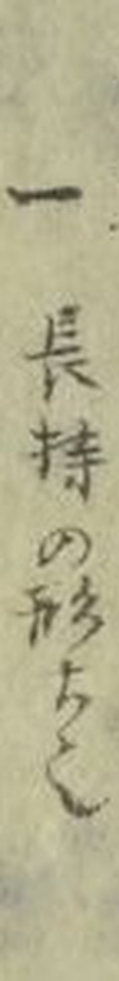長持の形ち也
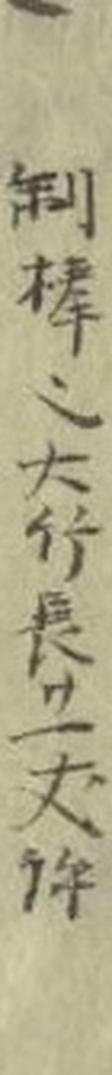制棒也大竹長サ一丈許
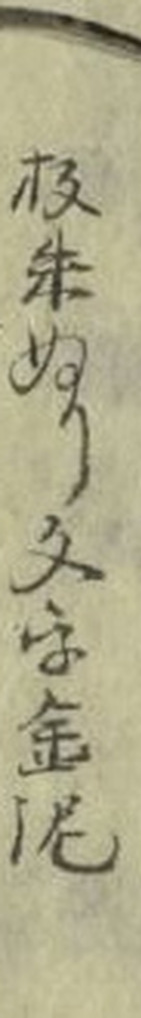板朱ぬり文字金泥
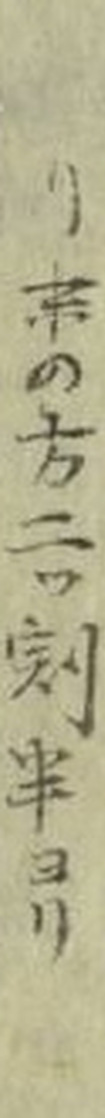り末の方二ツ割半ヨリ
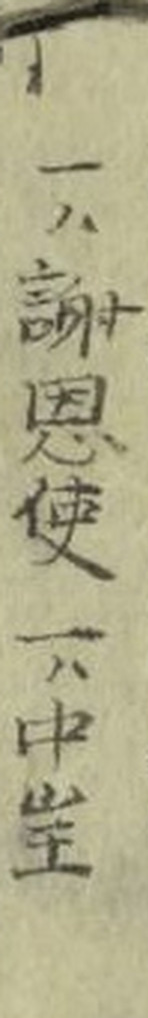一ハ謝恩使一ハ中山王
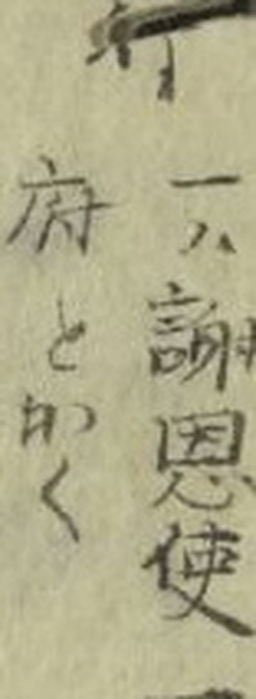府とかく
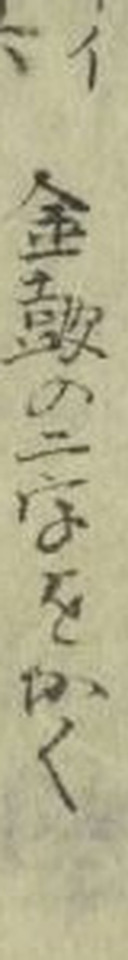金皷の二字をかく
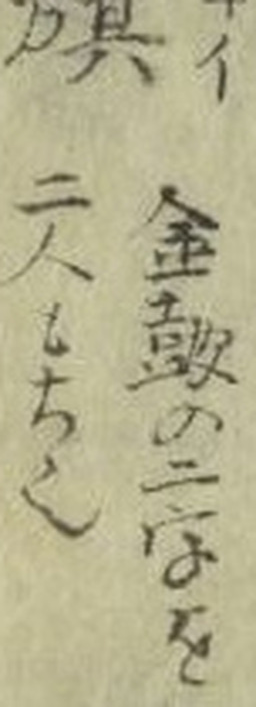二人もち也
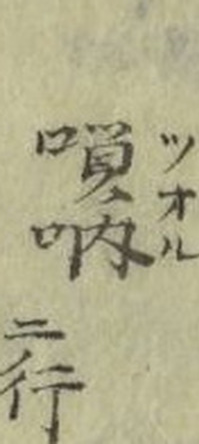嗩吶二行
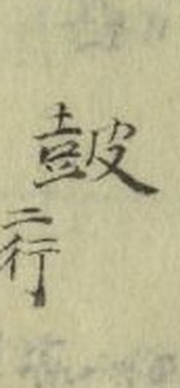牌二行
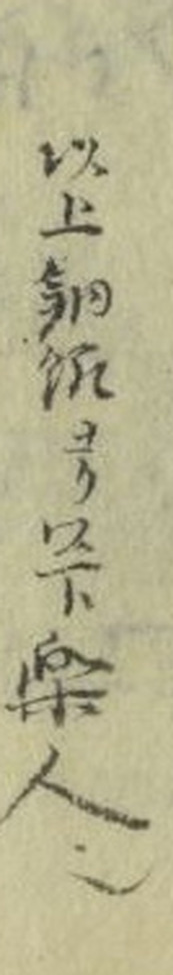以上銅鑼ヨリ以下楽人也
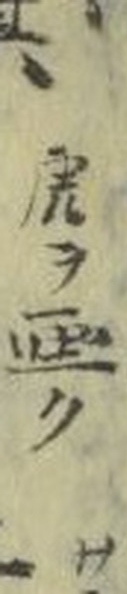虎ヲ画ク
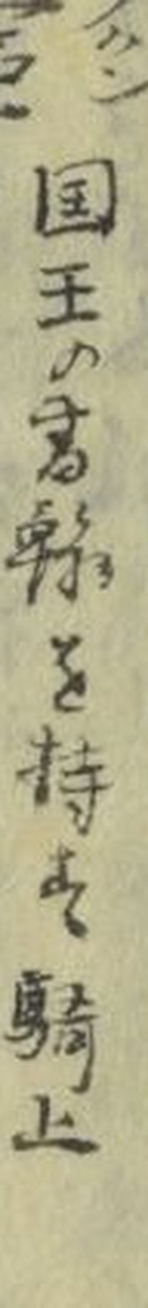国王の書翰を持す騎上
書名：天保三年来朝 琉球人行列記
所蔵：University of the Ryukyus Library
